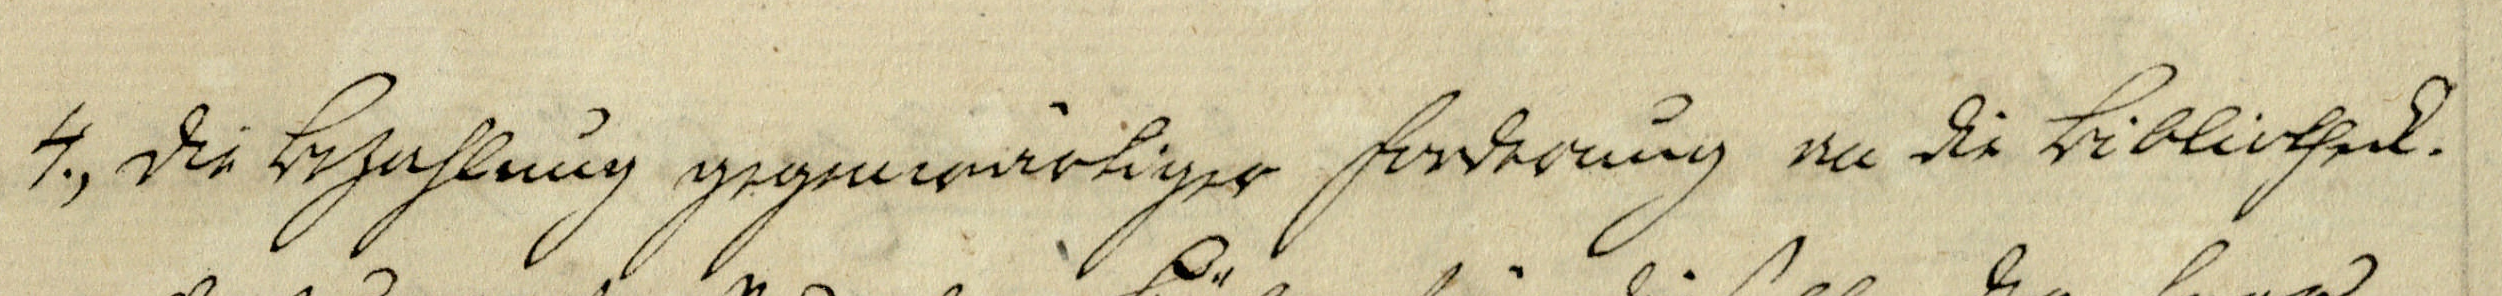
4., die Bezahlung gegenwärtiger Forderung an die Bibliothek.
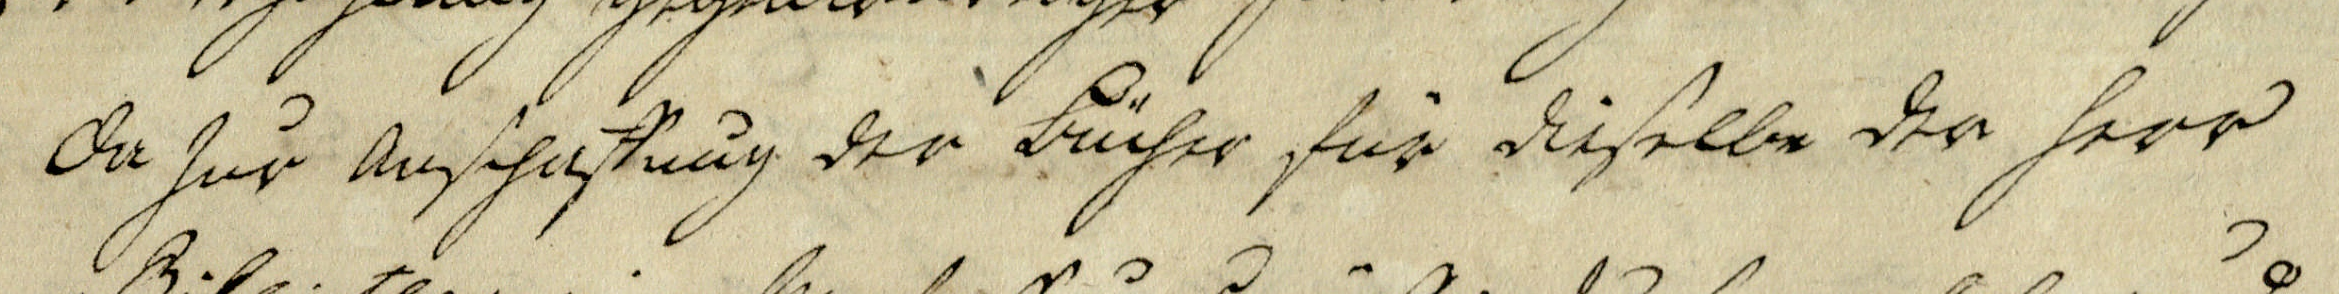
Da zur Anschaffung der Bücher für dieselbe der Herr
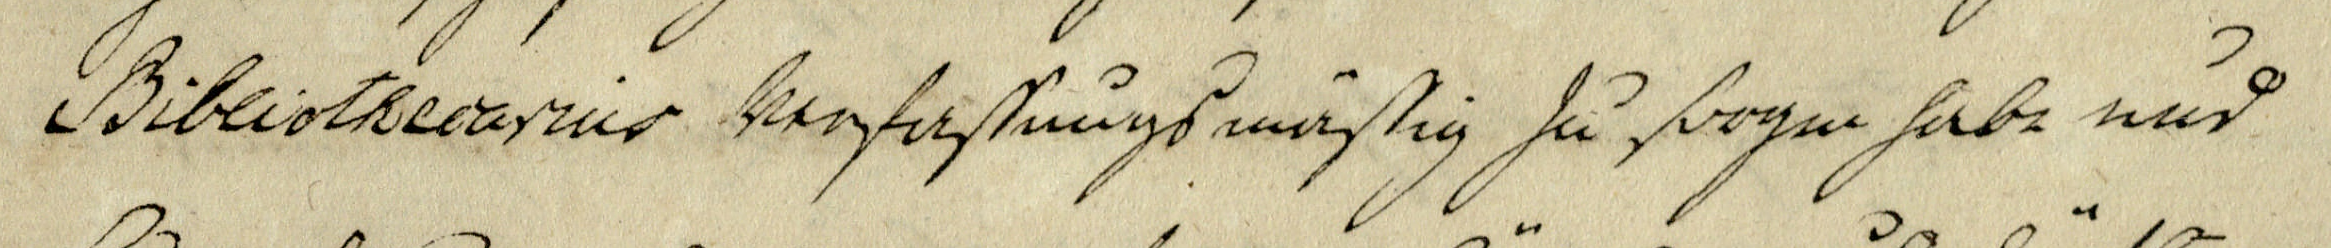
Bibliothecarius Verfassungsmässig zu sorgen habe und
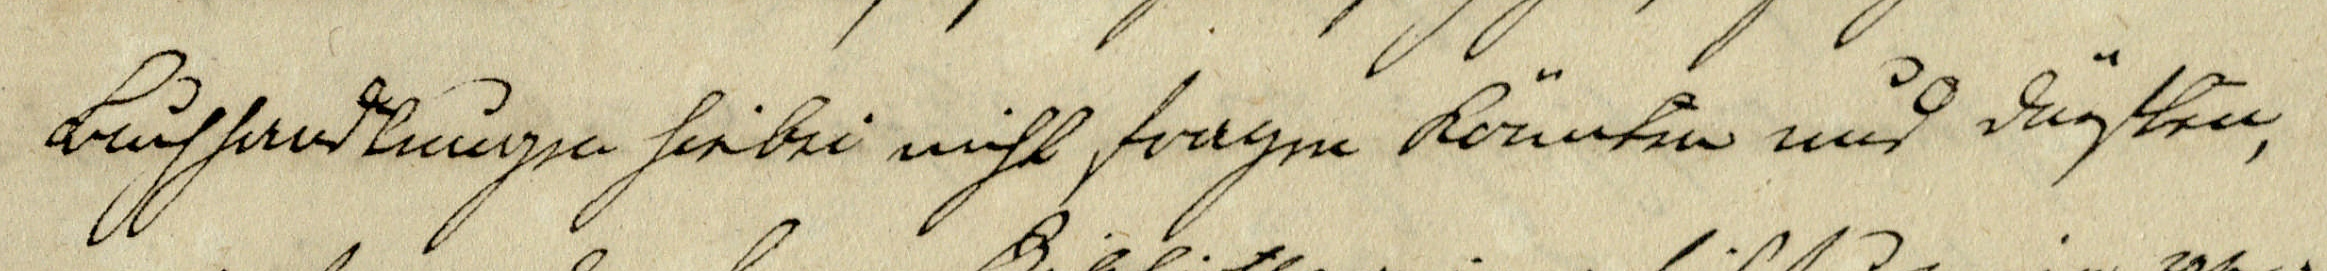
Buchhandlungen hiebei nicht fragen könnten und dürften,
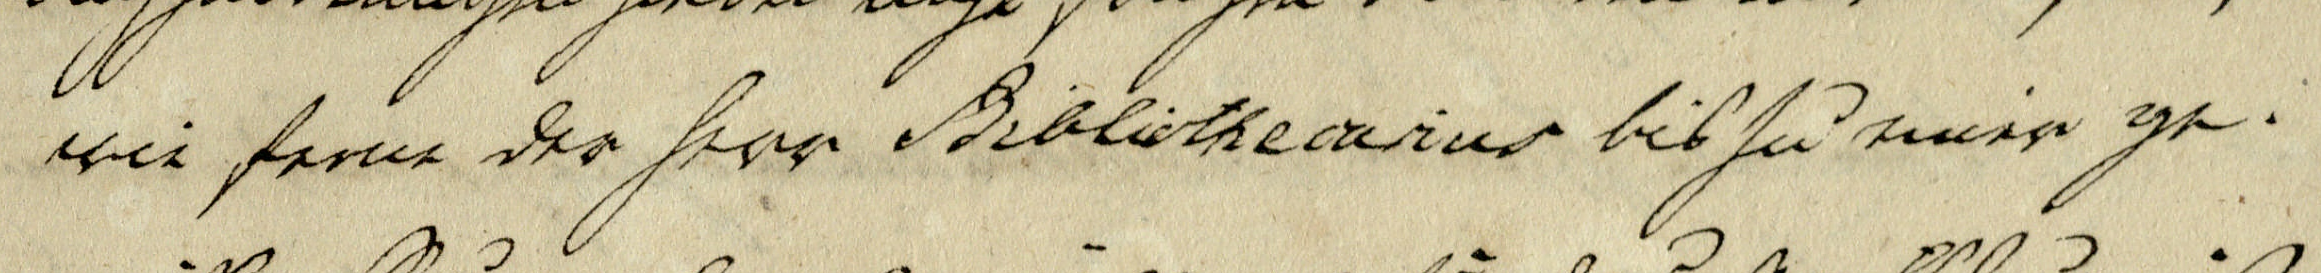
wie ferne der Herr Bibliothecarius bis zu einer ge¬
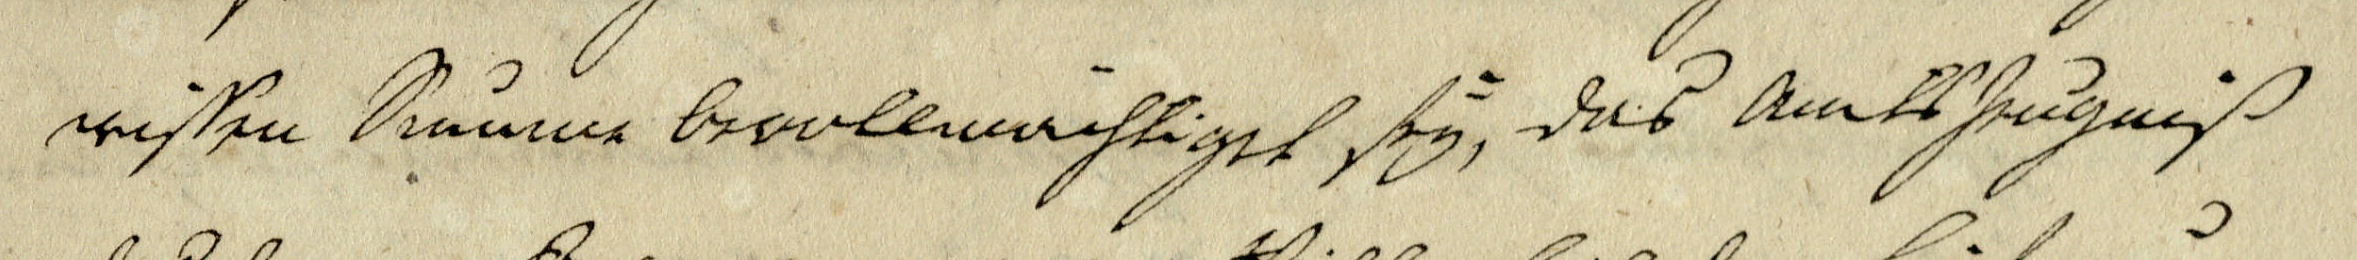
wissen Summe bevollmächtiget seÿ, das Amts Zeugniß
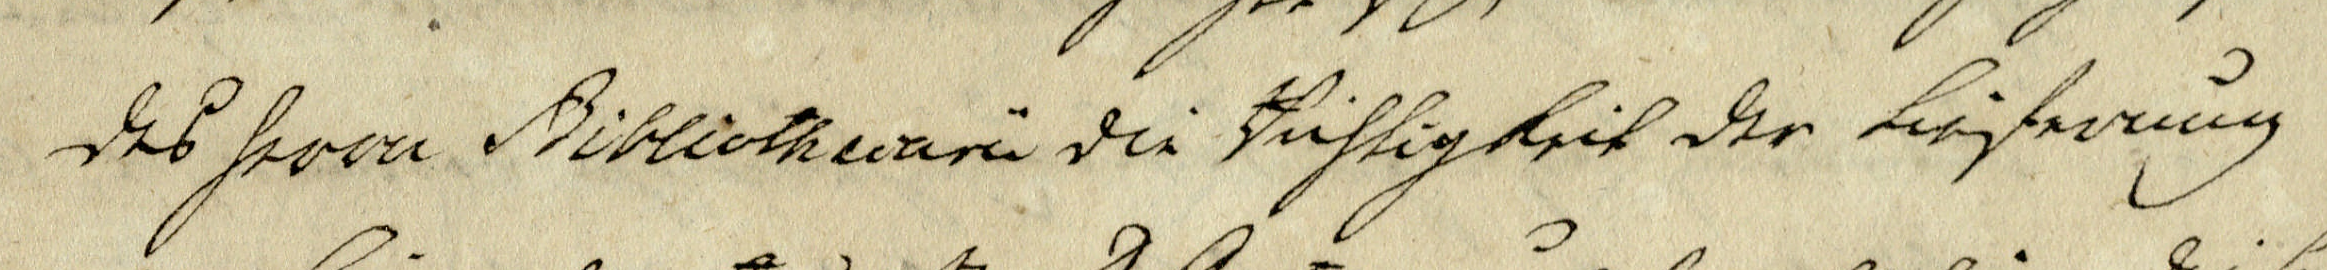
des Herrn Bibliothecarii die Richtigkeit der Lieferung
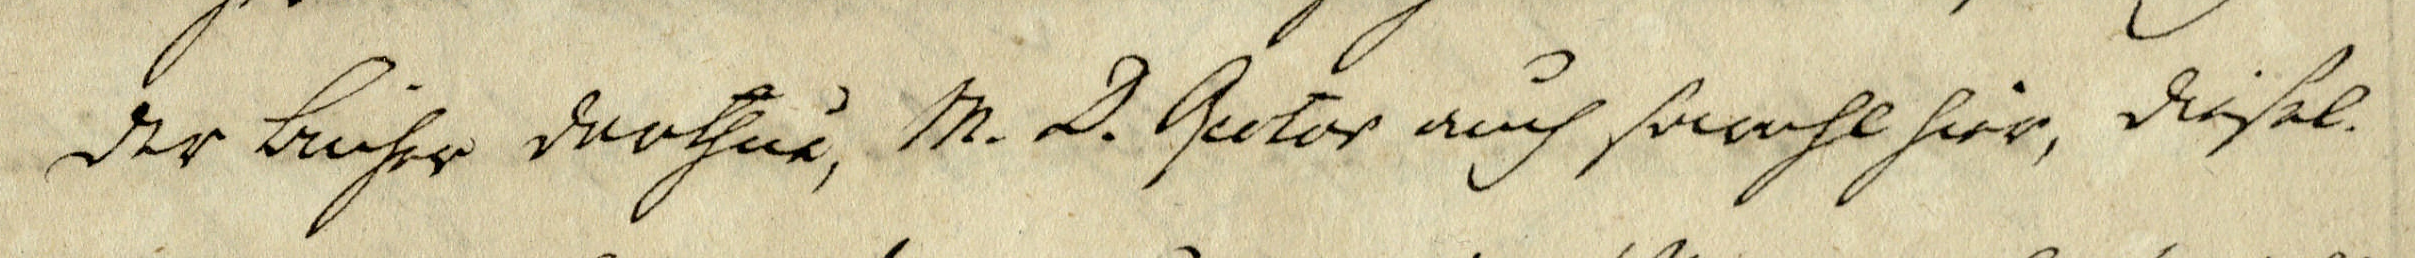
der Bücher darthun, M. D. Rector auch sowohl hier, diesel¬
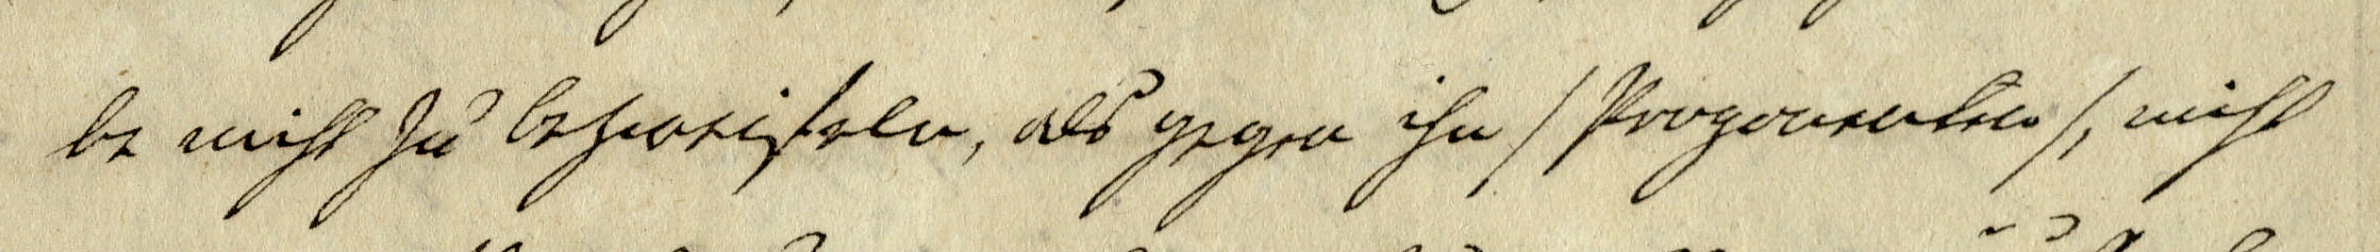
be nicht zu bezweifeln, als gegen ihn /Proponenten /, nicht
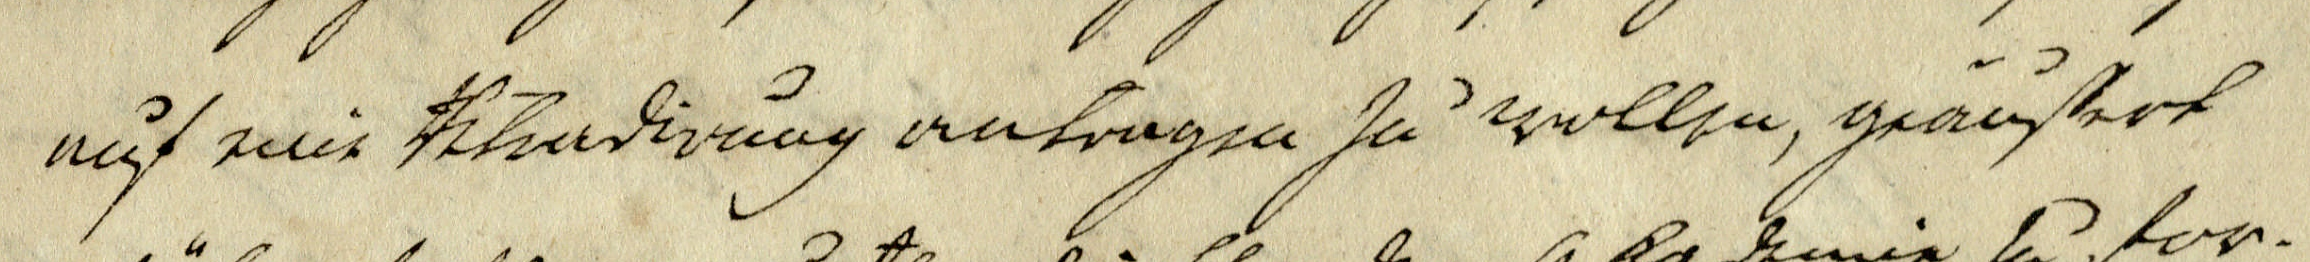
auf eine Retradirung antragen zu wollen, geäussert
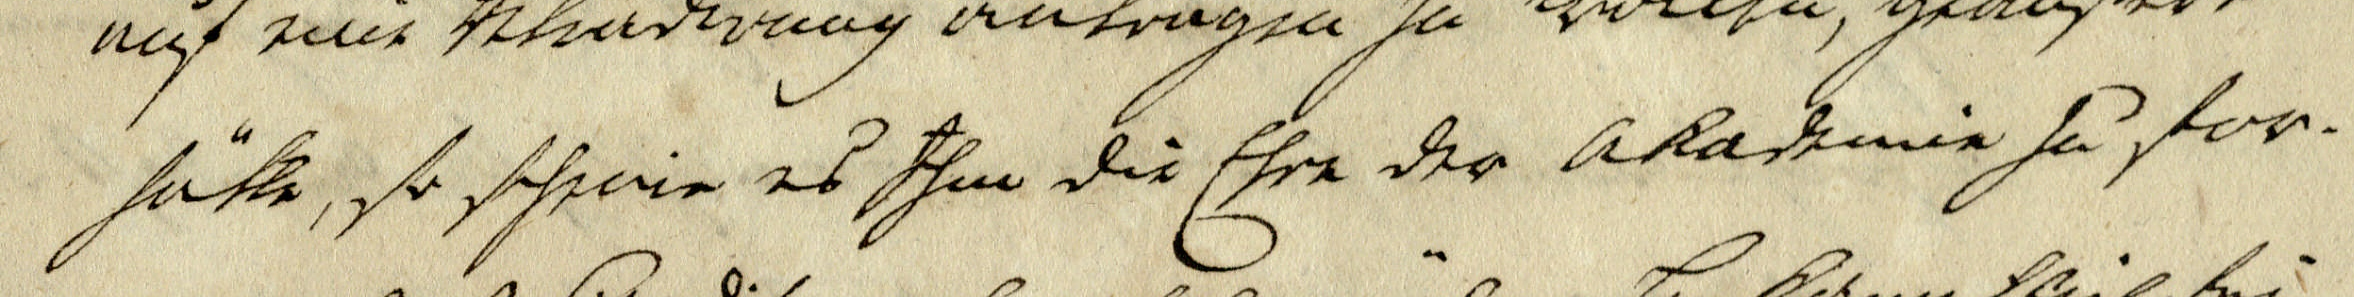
hätte, so scheine es Ihm die Ehre der Akademie zu for¬
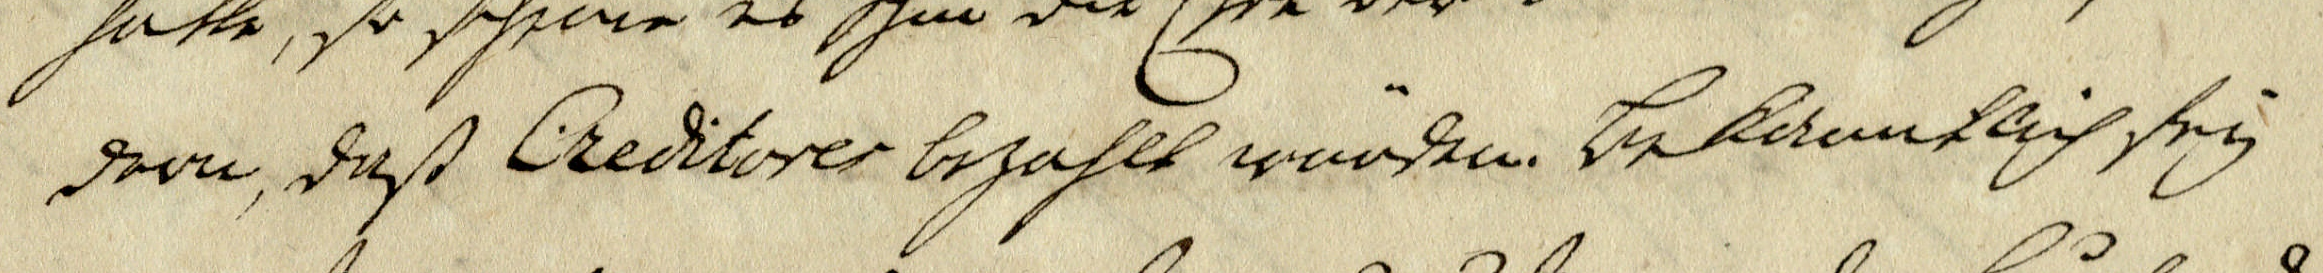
dern, daß Creditores bezahlt würden. Bekanntlich seÿ
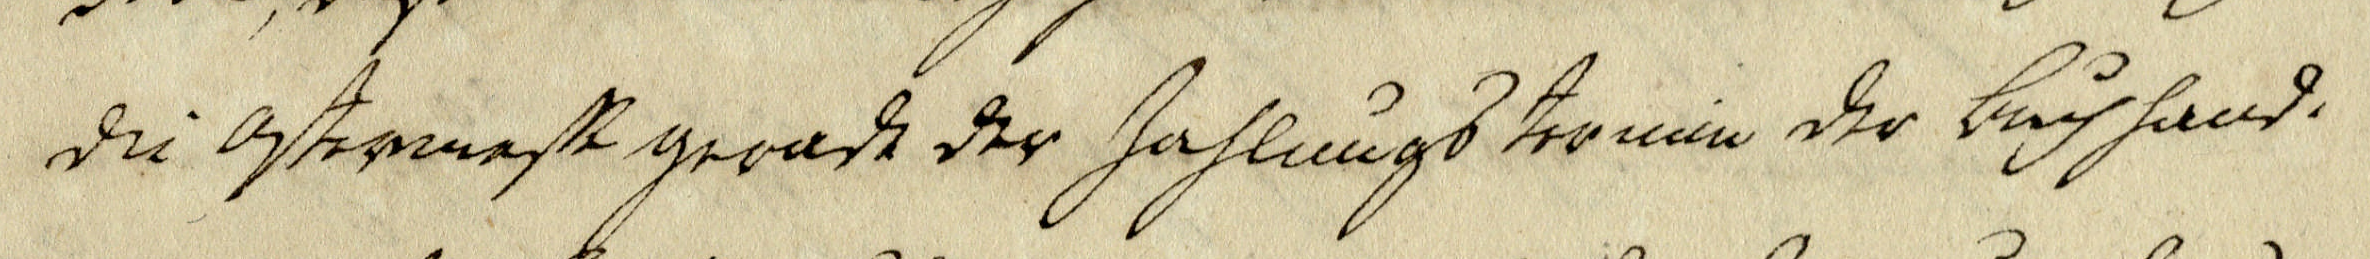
die Ostermesse gerade der ZahlungsTermin der Buchhand¬
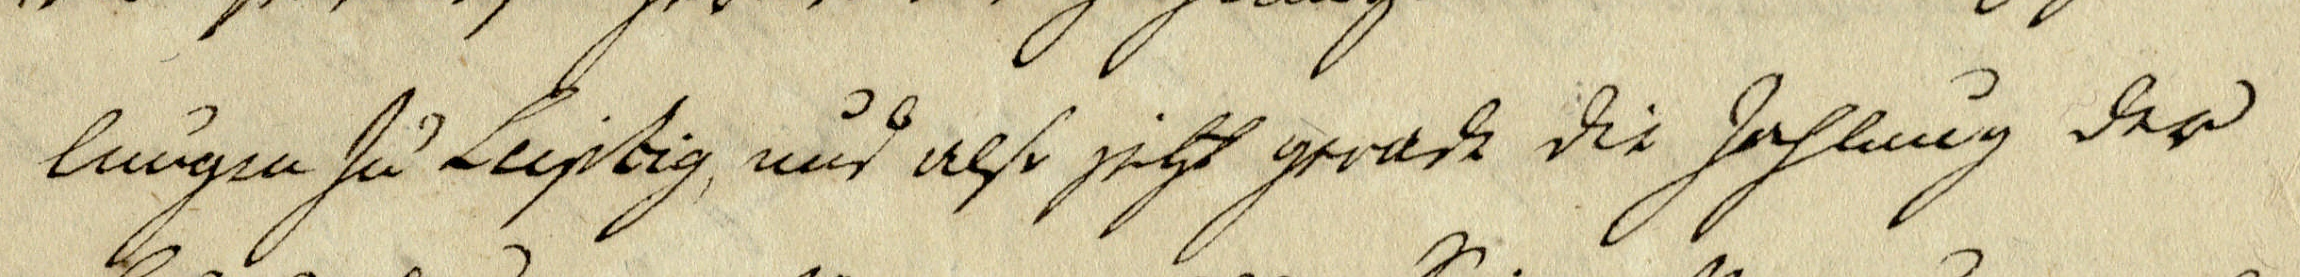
lungen zu Leipzig, und also jetzt gerade die Zahlung der
